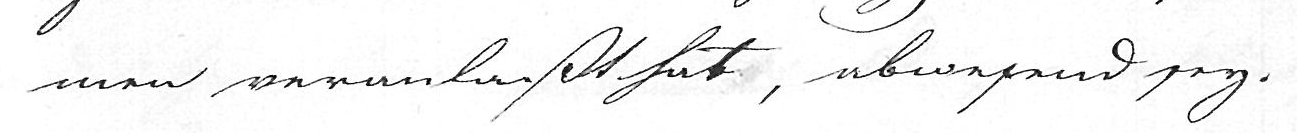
men veranlaßt hat, abwesend sey.
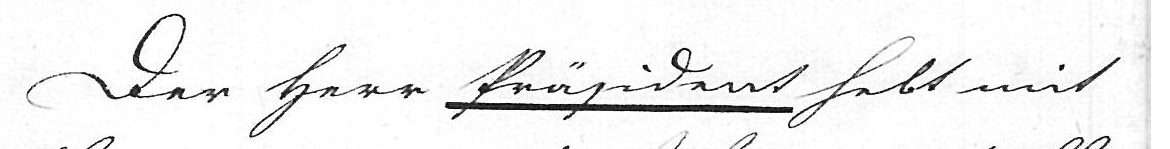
Der Herr Präsident hebt mit
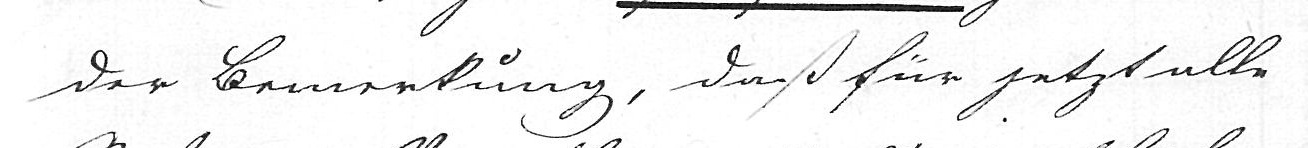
der Bemerkung, daß für jetzt alle
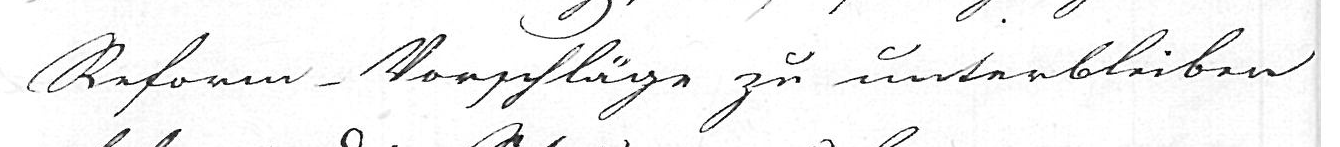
Reform-Vorschläge zu unterbleiben
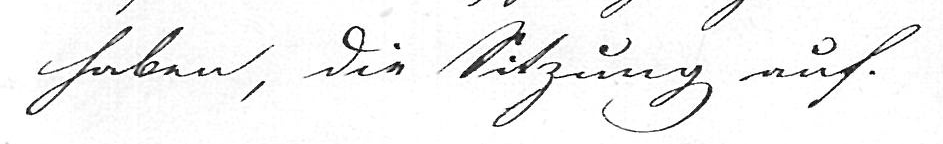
haben, die Sitzung auf.
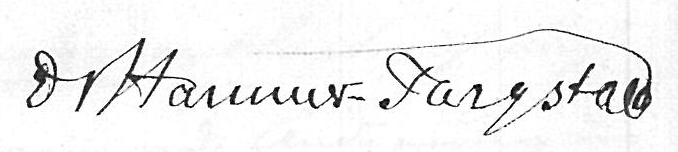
vHammer-Purgstall
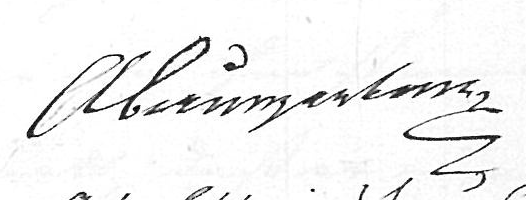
ABaumgartner
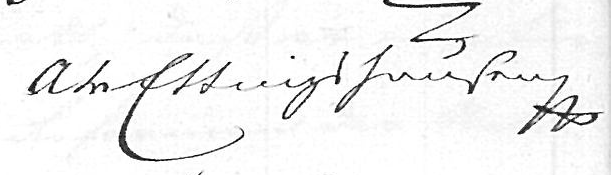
AvEttingshausen
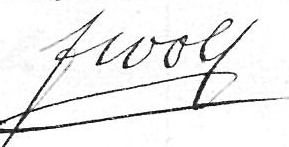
FWolf
